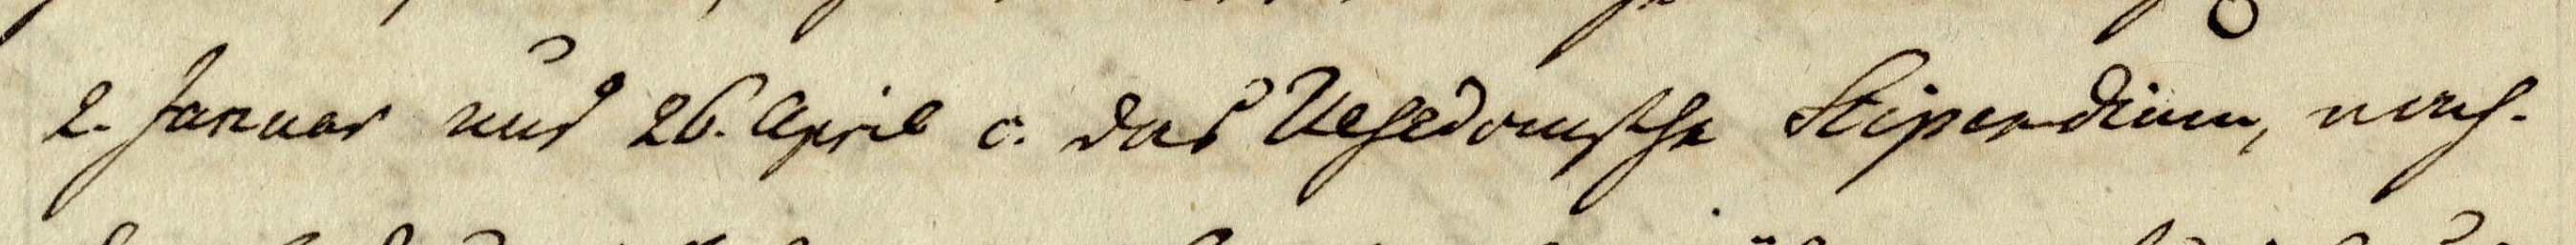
2. Januar und 26. April c. das Uesedomsche Stipendium, nach¬
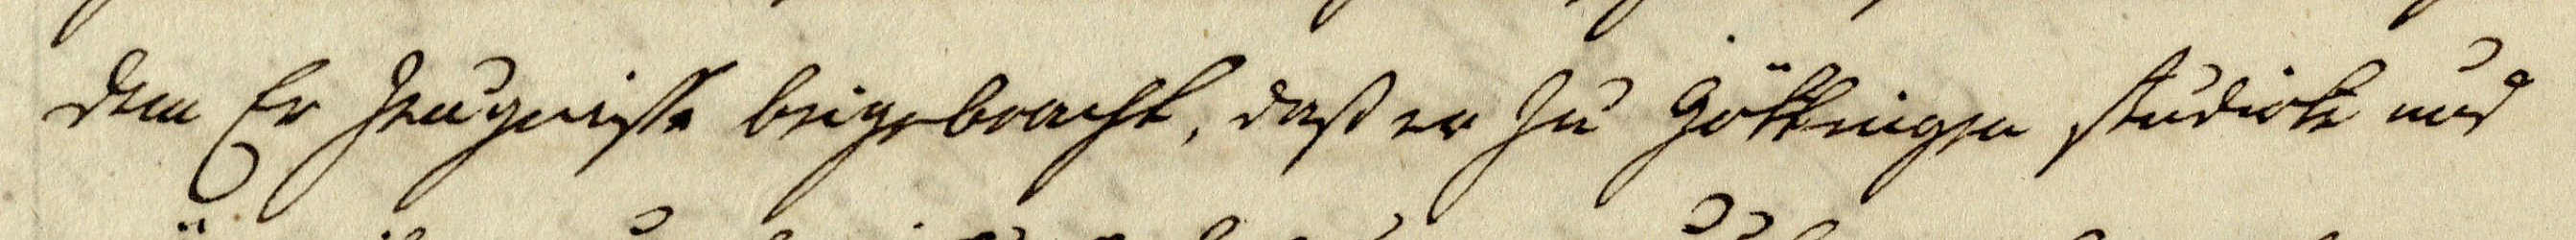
dem Er Zeugnisse beigebracht, daß er zu Göttingen studirte und
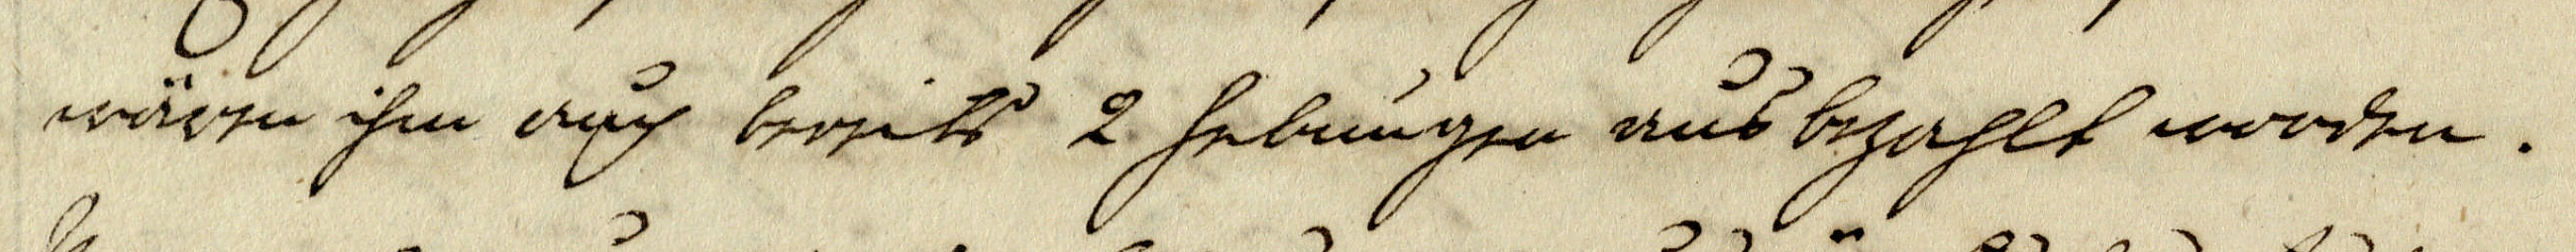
wären ihm auch bereits 2 Hebungen aus bezahlt worden.
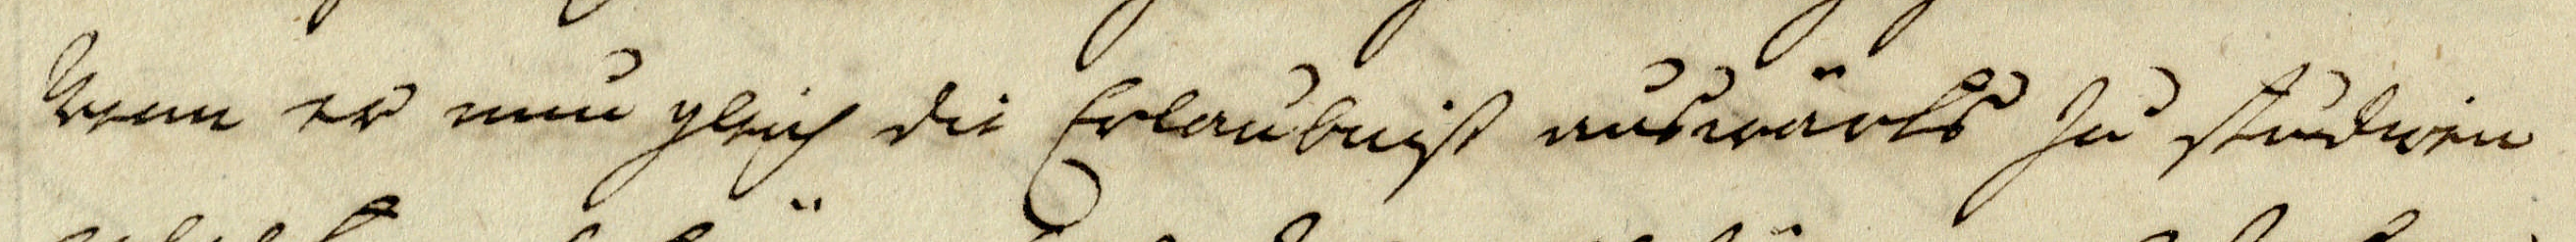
Wenn er nun gleich die Erlaubniß auswärts zu studiren
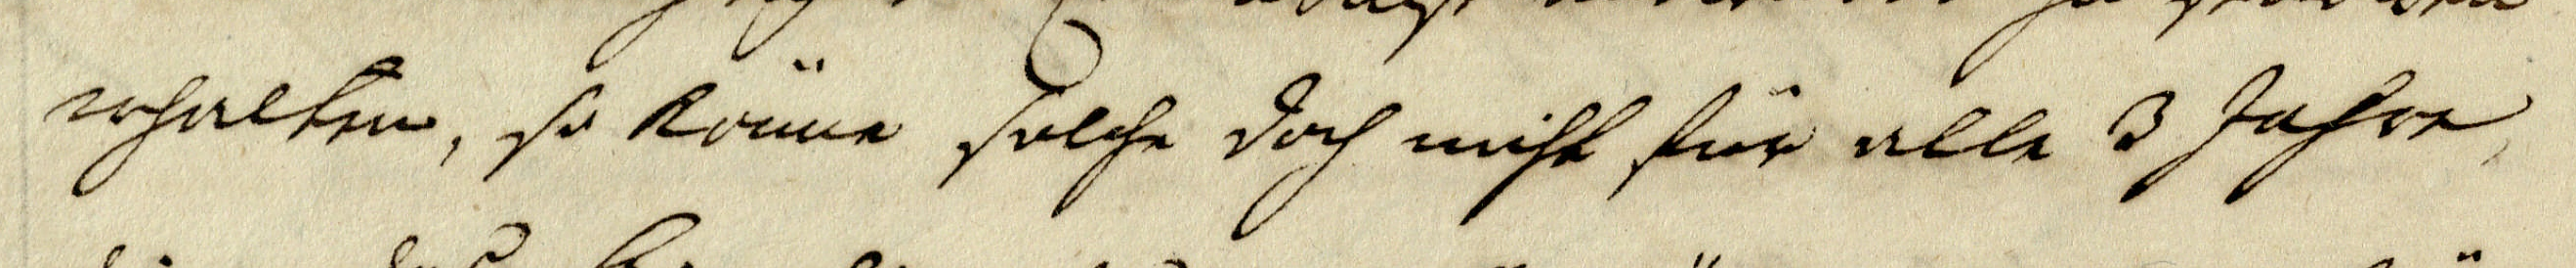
erhalten, so könne solche doch nicht für alle 3 Jahre
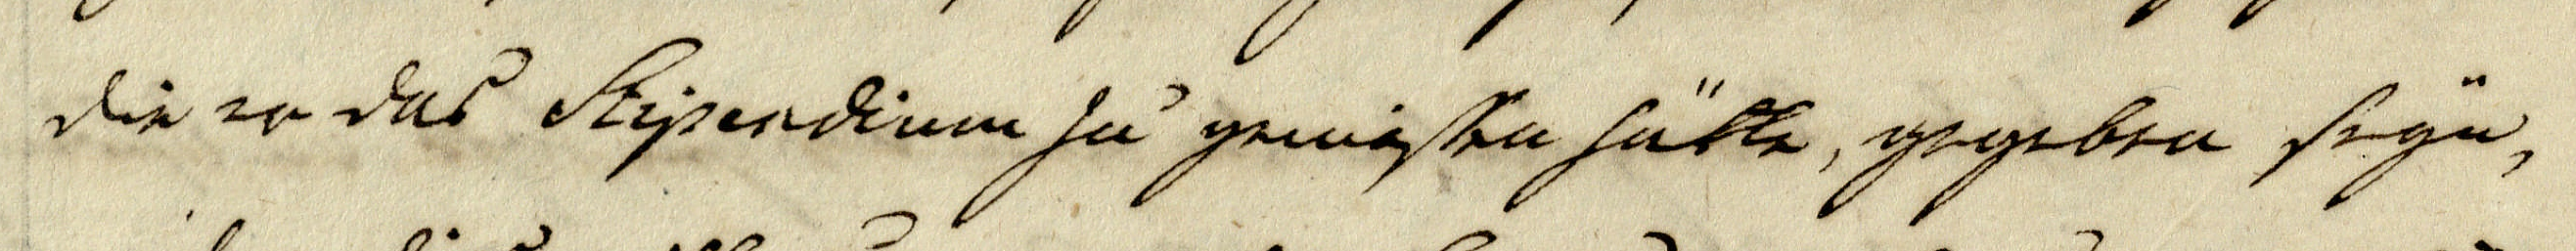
die er das Stipendium zu geniessen hätte, gegeben seÿn,
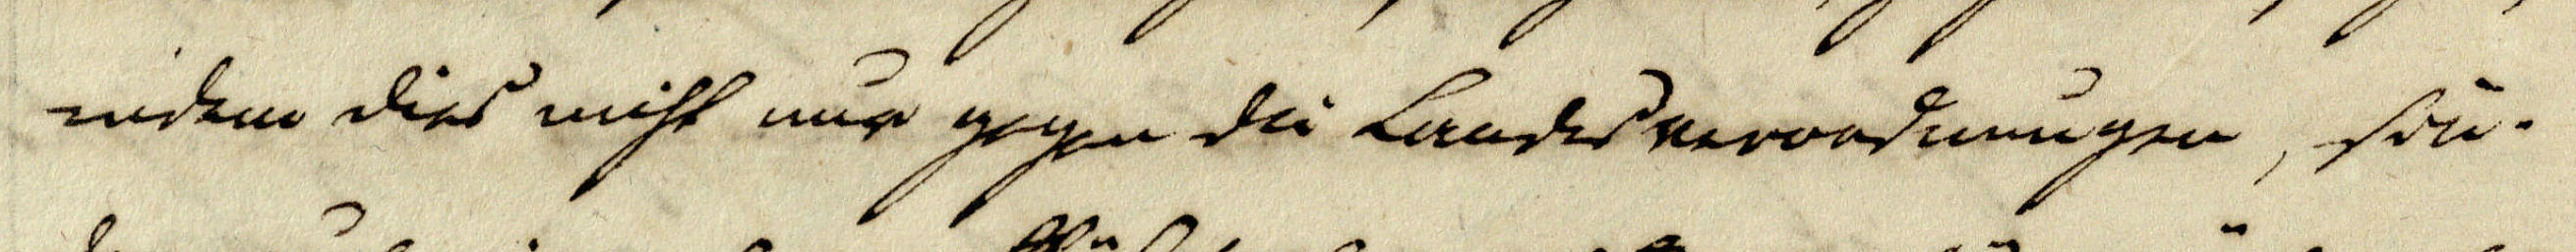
indem dies nicht nur gegen die Landesverordnungen, son¬
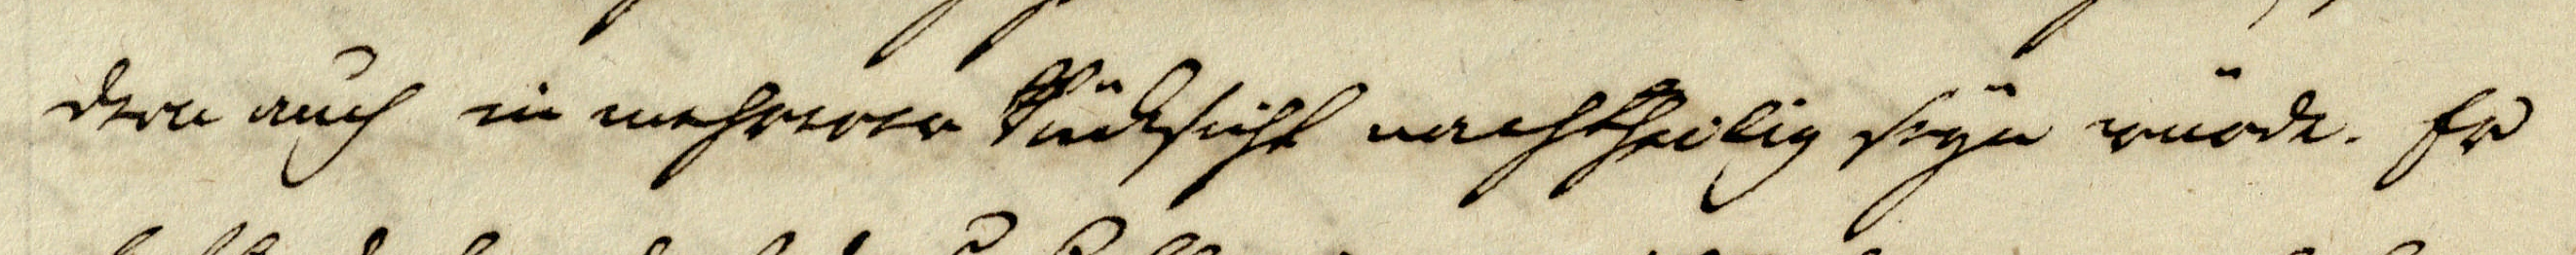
dern auch in mehrerer Rücksicht nachtheilig seÿn würde. Er
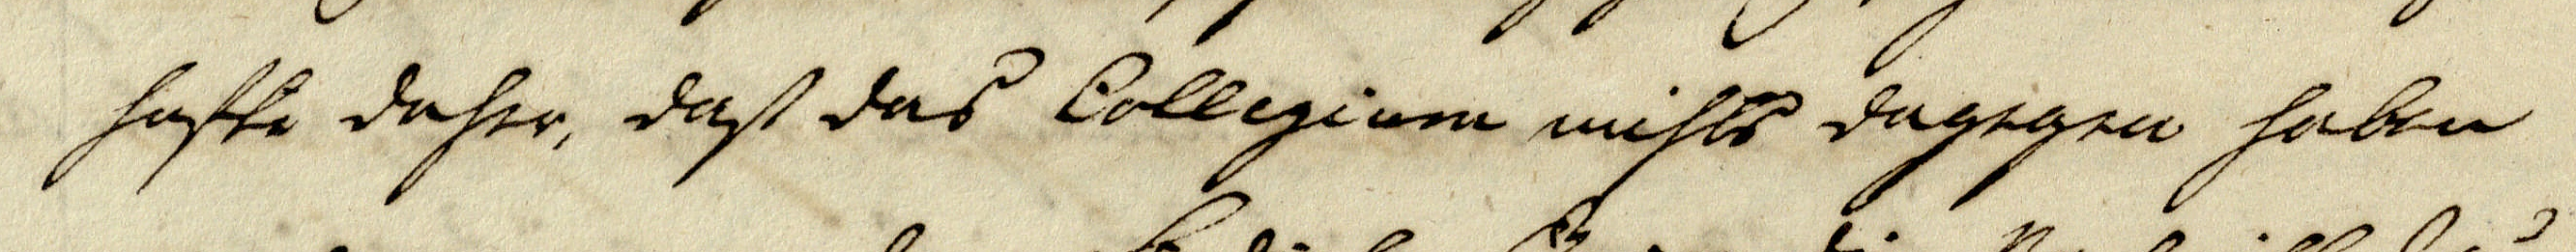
hofte daher, daß das Collegium nichts dagegen haben
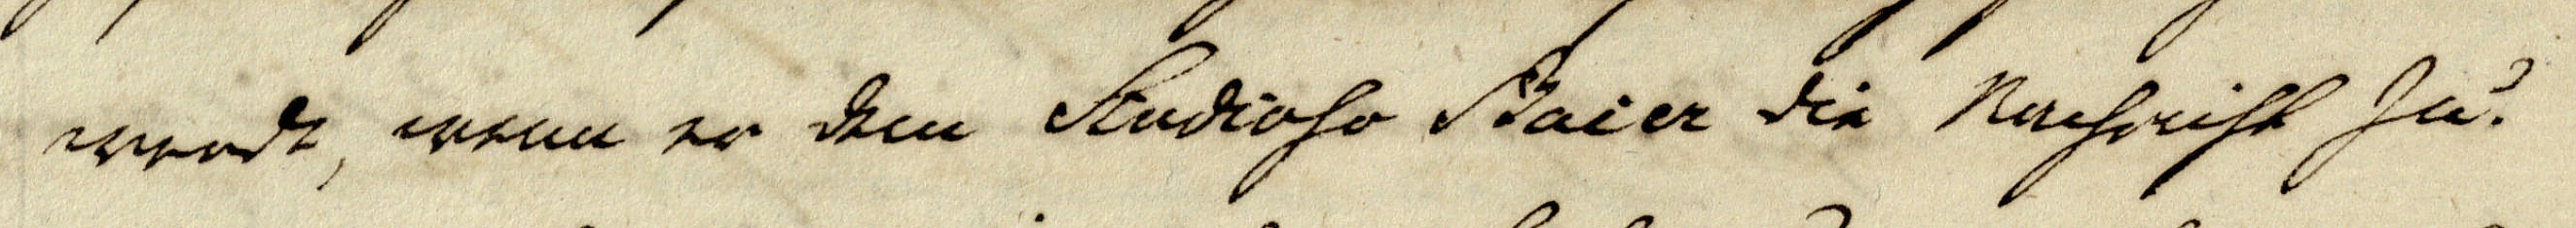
werde, wenn er dem Studioso Baier die Nachricht zu¬
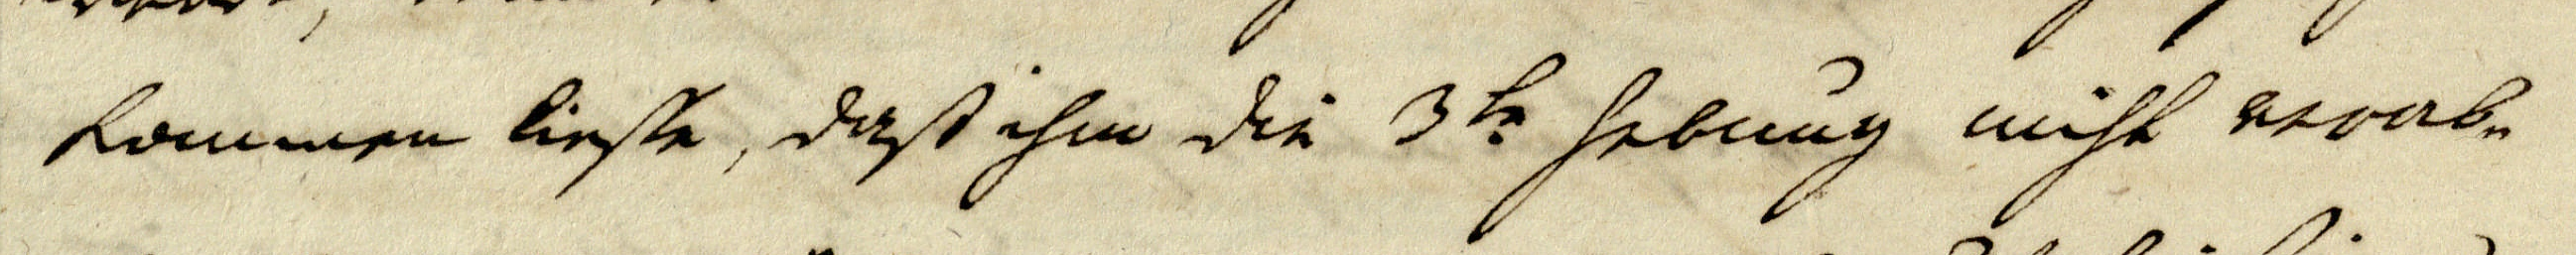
kommen liesse, daß ihm die 3 te Hebung nicht verab¬
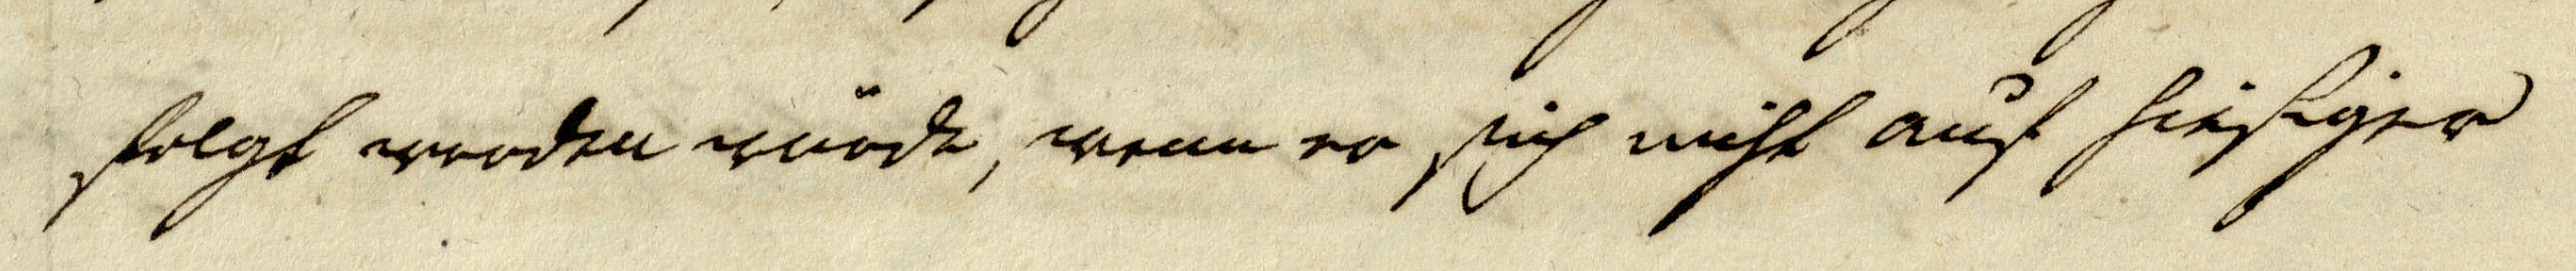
folgt worden würde, wenn er sich nicht auf hiesiger
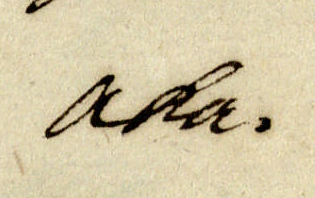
Aka¬
